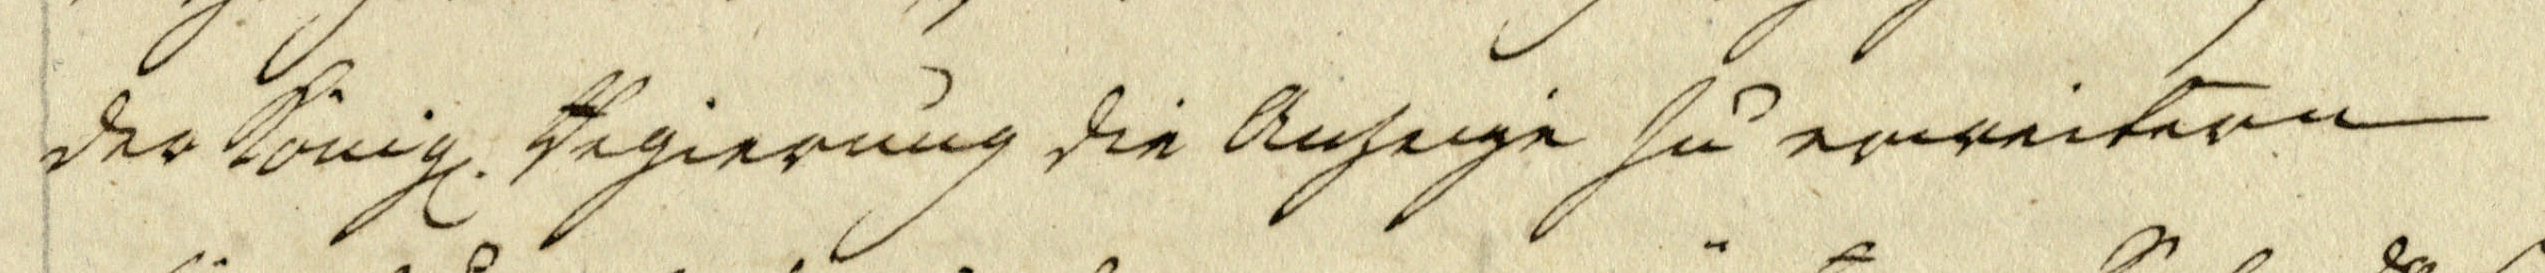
der Königl. Regierung die Anzeige zu erweitern
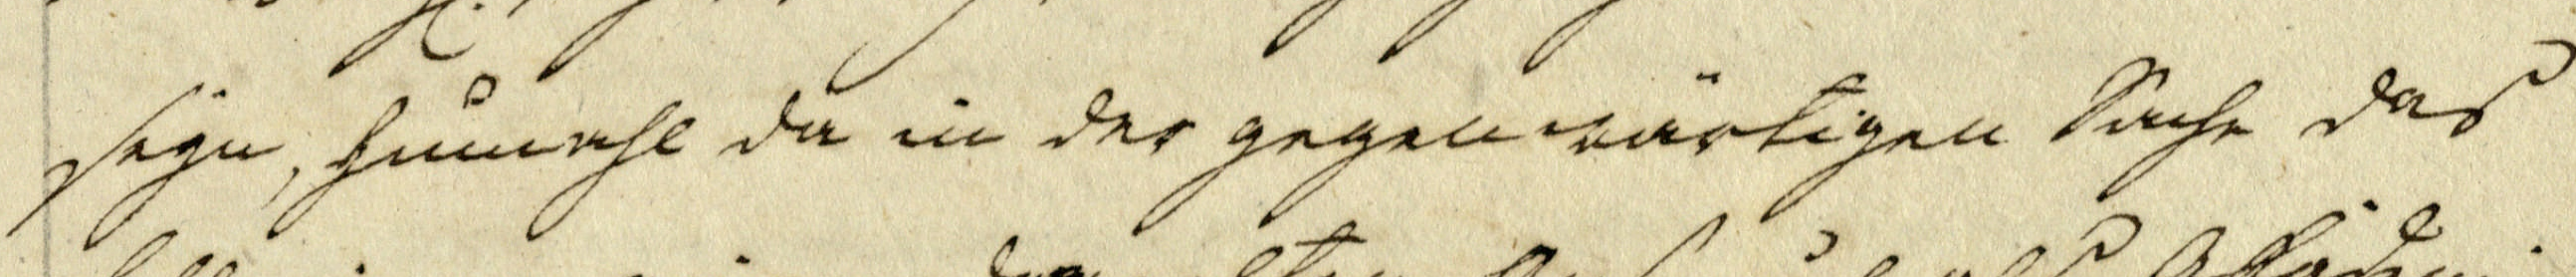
seÿn, zumahl da in der gegenwärtigen Sache das
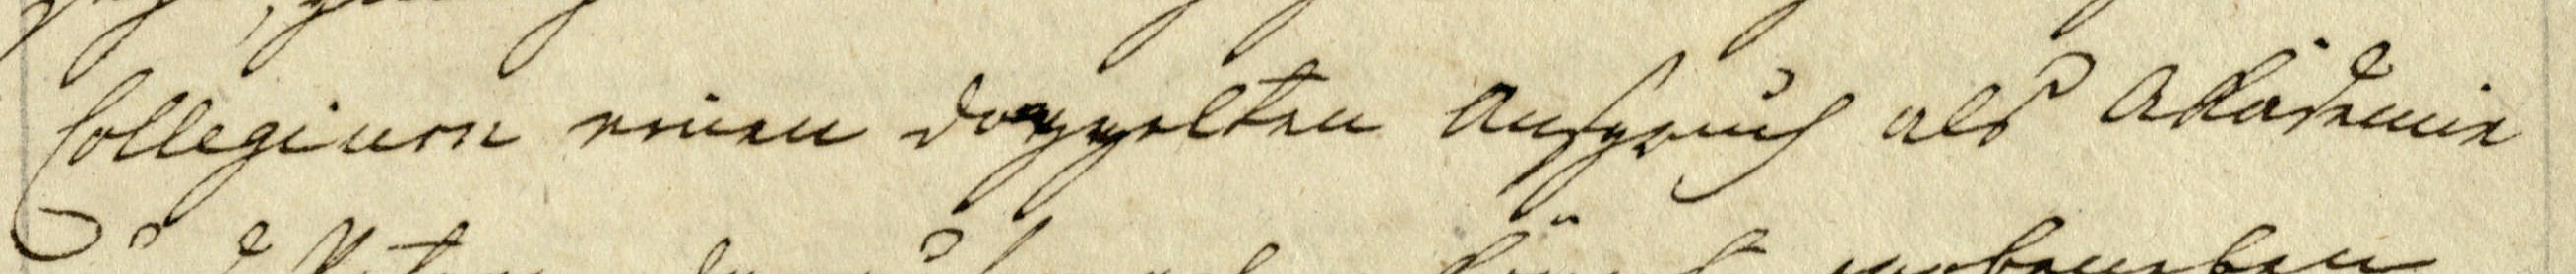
Collegium einen doppelten Anspruch als Akademie
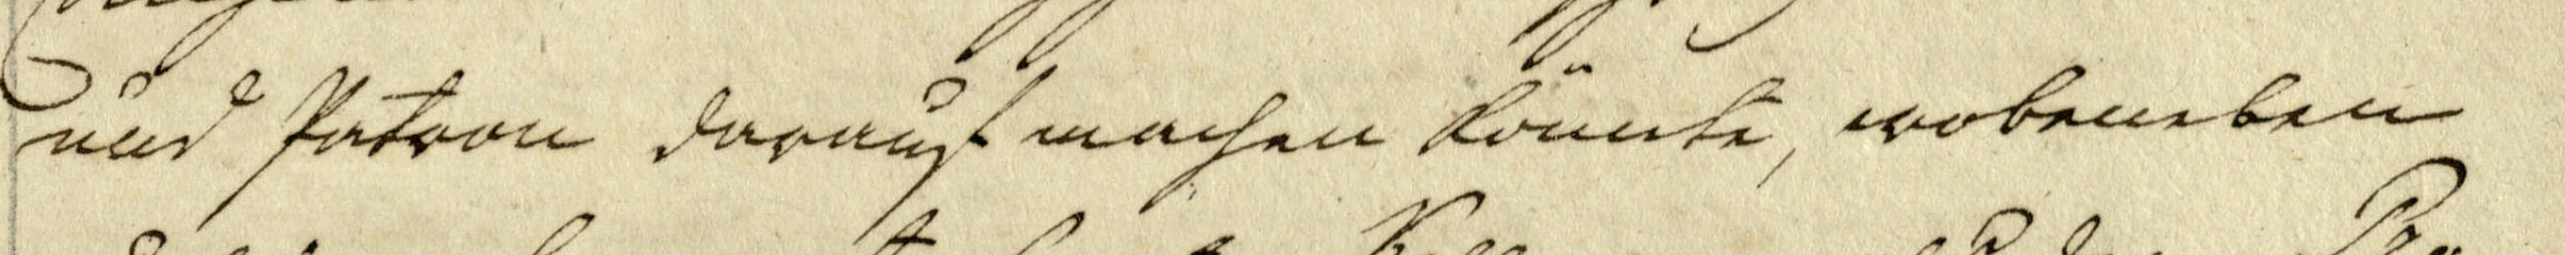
und Patron darauf machen könnte, wobeneben
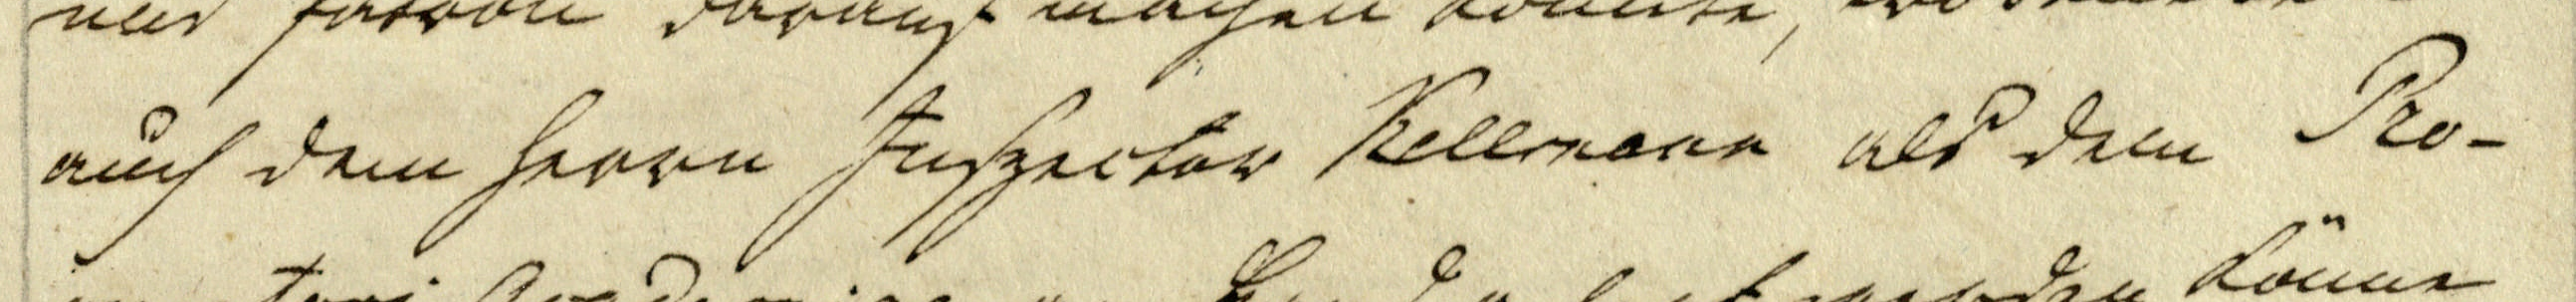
auch dem Herrn Inspector Kellmann als dem Pro¬
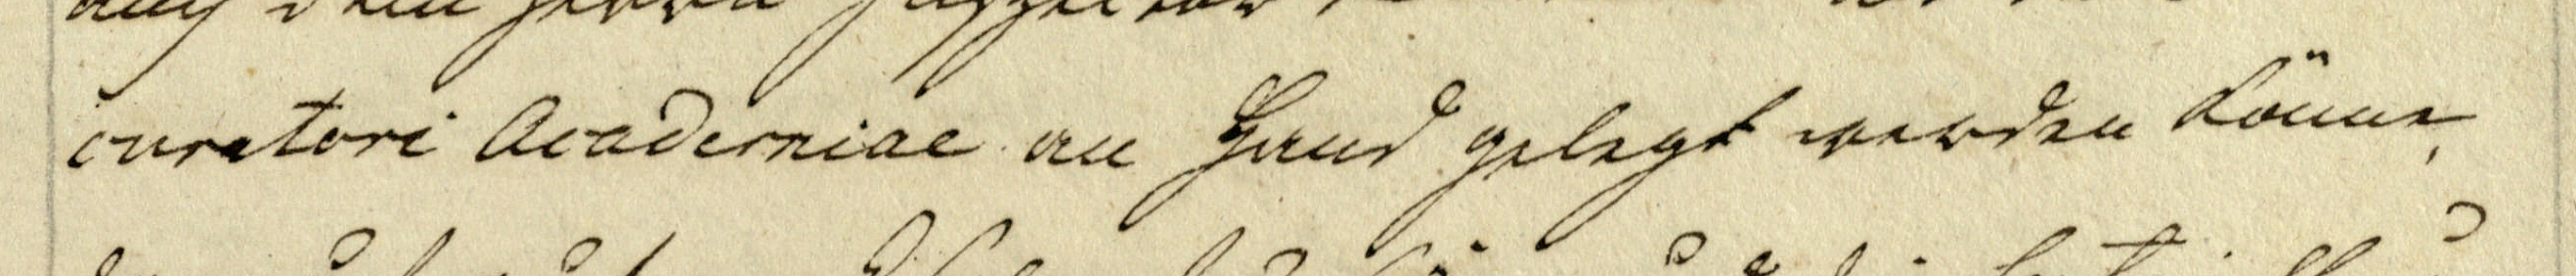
curatori Academiae an Hand gelegt werden könne,
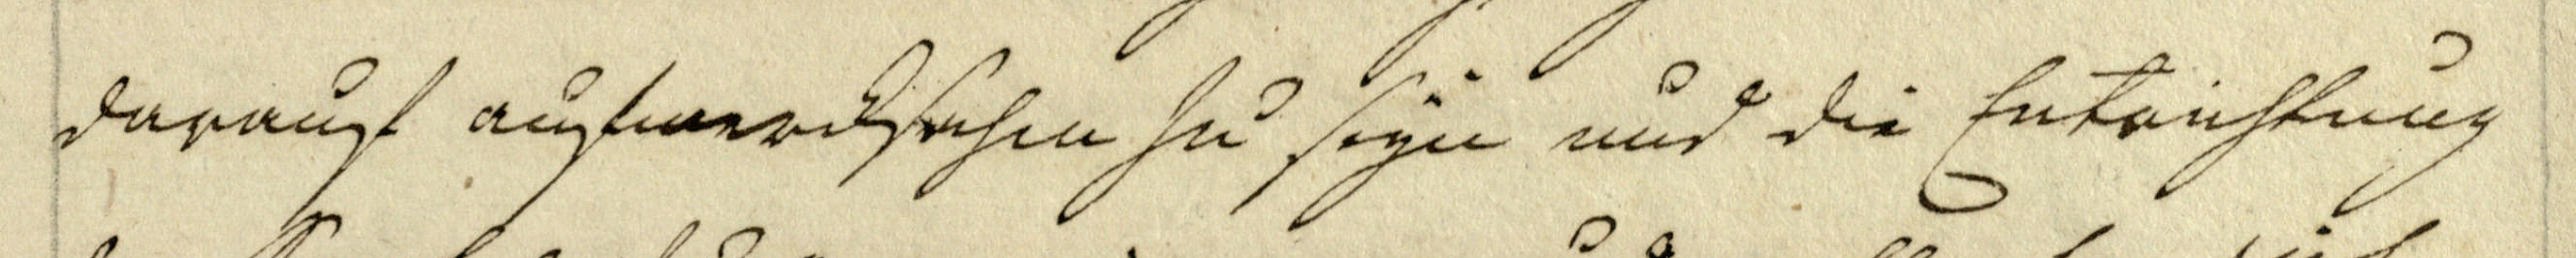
darauf aufmercksahm zu seÿn und die Entrichtung
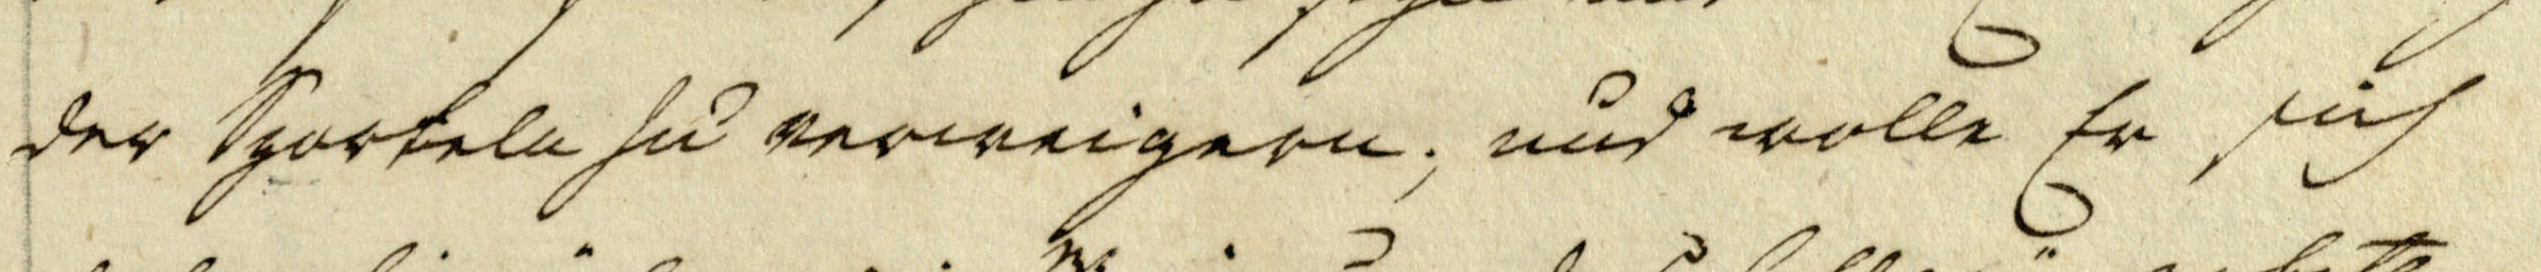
der Sporteln zu verweigern; und wolle Er sich
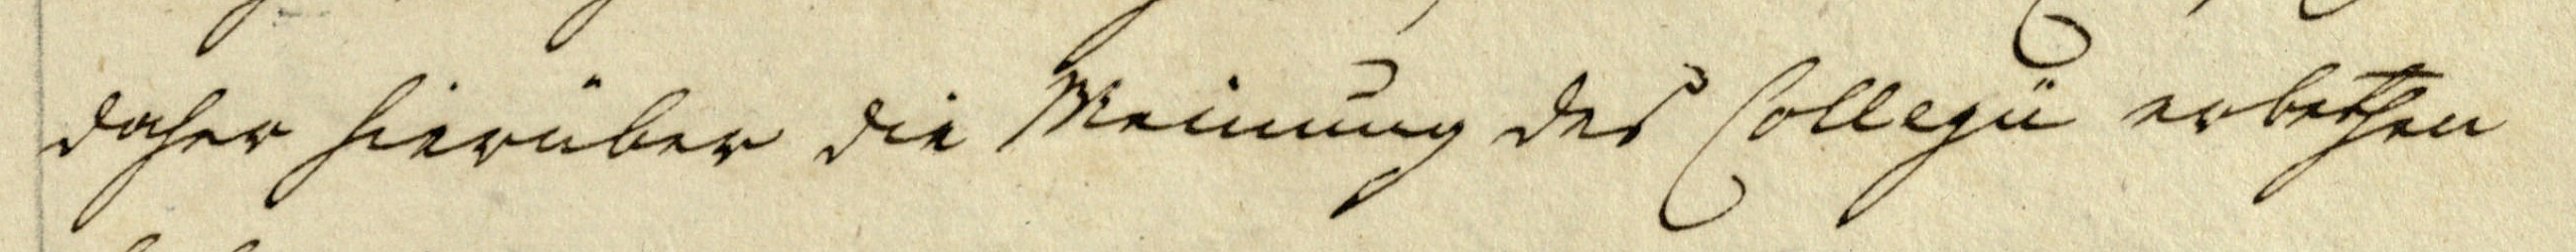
daher hierüber die Meinung des Collegii erbethen
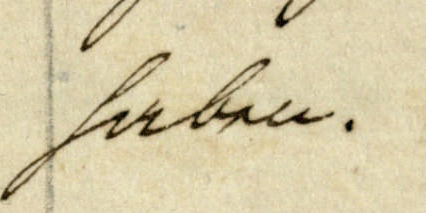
haben.
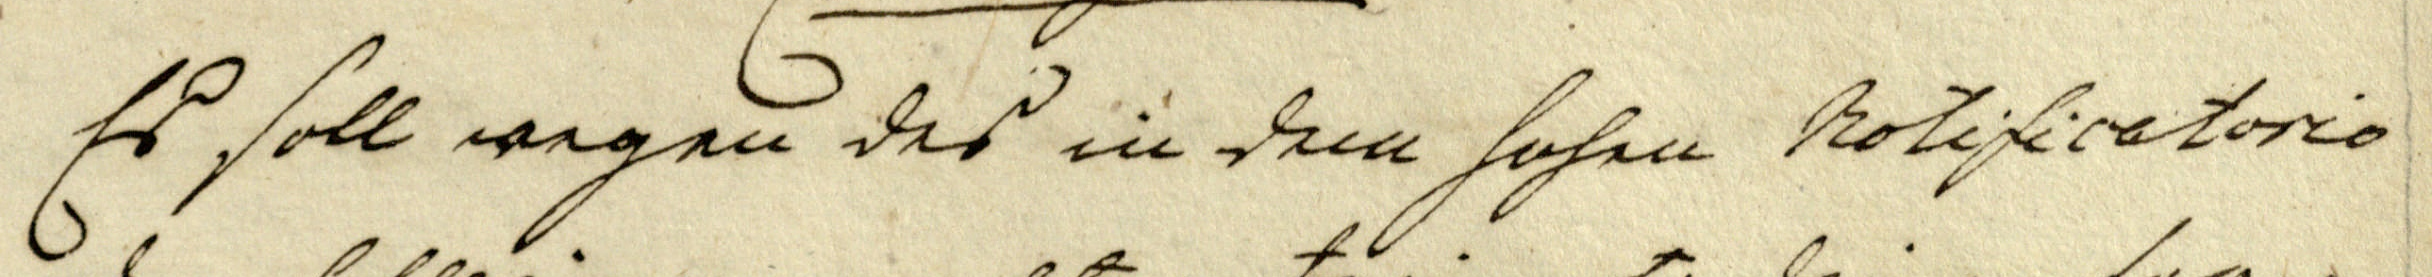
Es soll wegen des in dem hohen Notificatorio
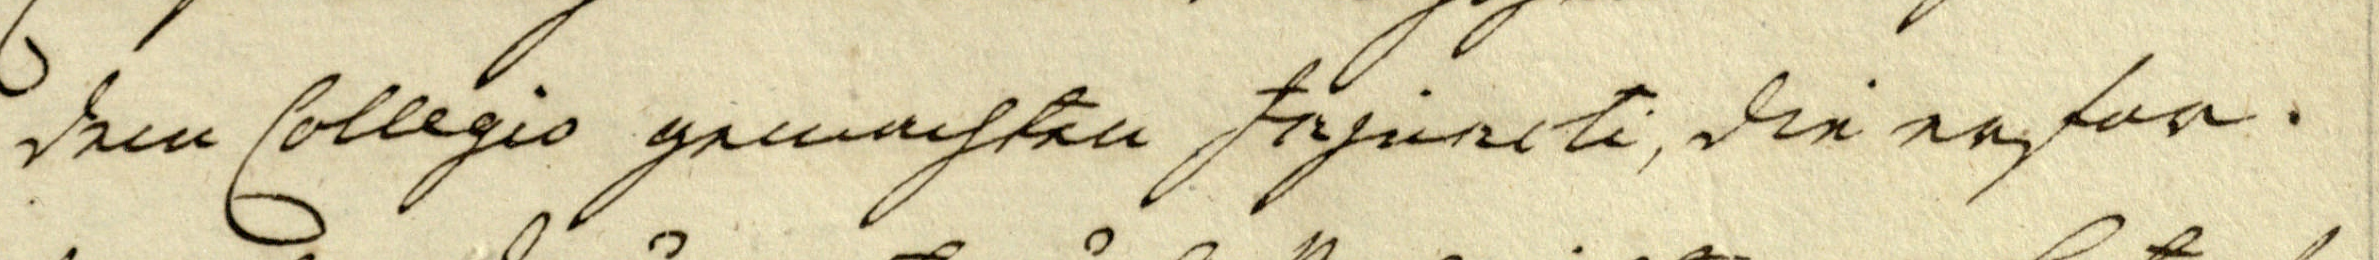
dem Collegio gemachten Injuncti, die erfor¬
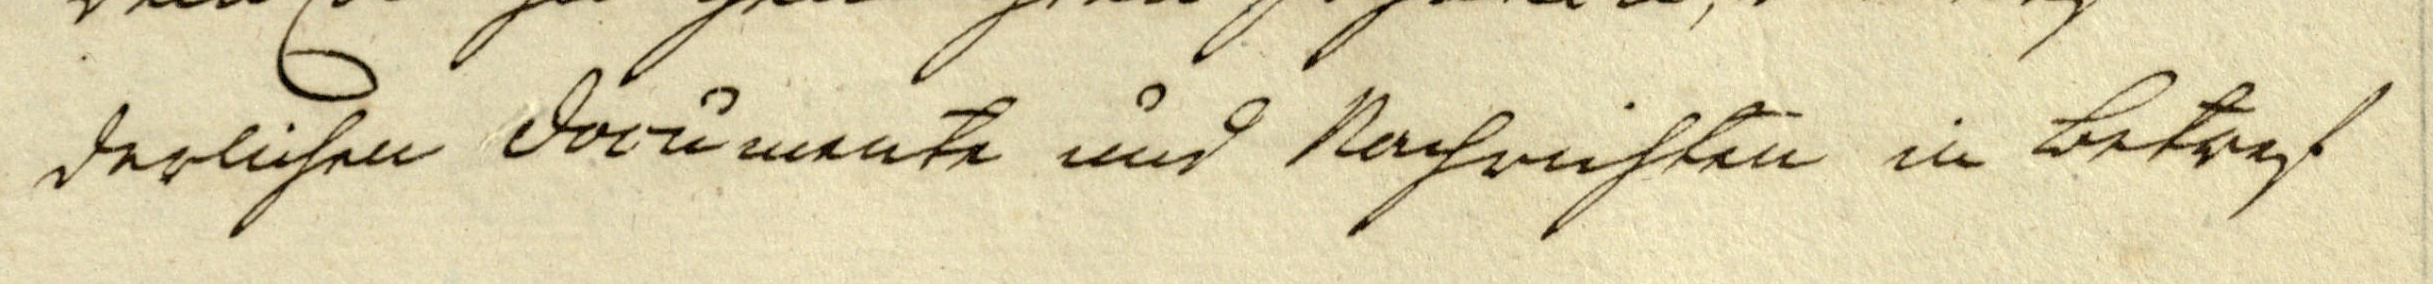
derlichen Documente und Nachrichten in Betref
